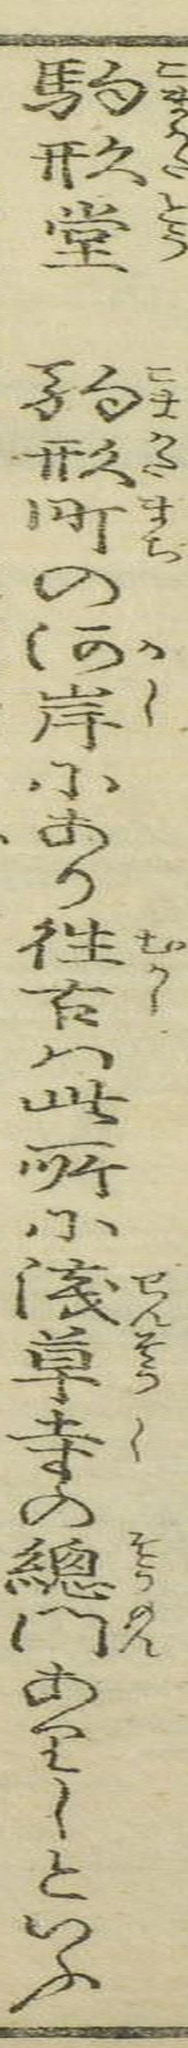駒形堂駒形町の河岸にあり往古は此所に浅草寺の総門ありしといふ
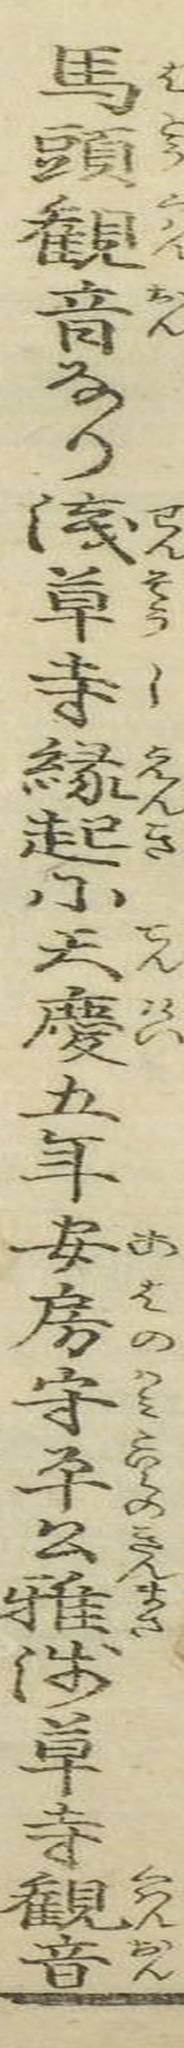馬頭観音なり浅草寺縁起に天慶五年安房守平公雅浅草寺観音
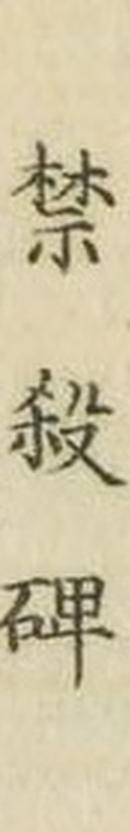禁殺碑
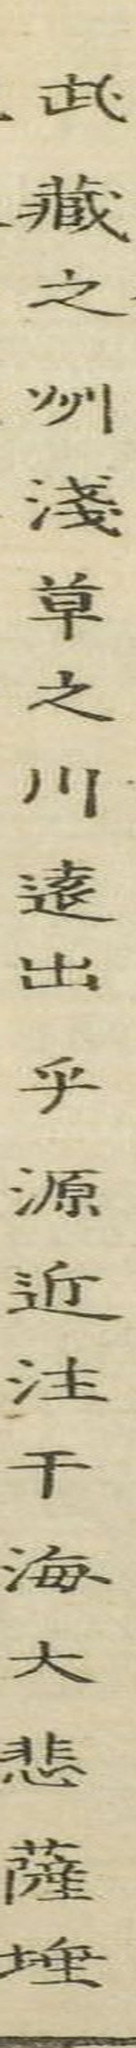武蔵之州浅草之川遠出乎源近注干海大悲薩埵
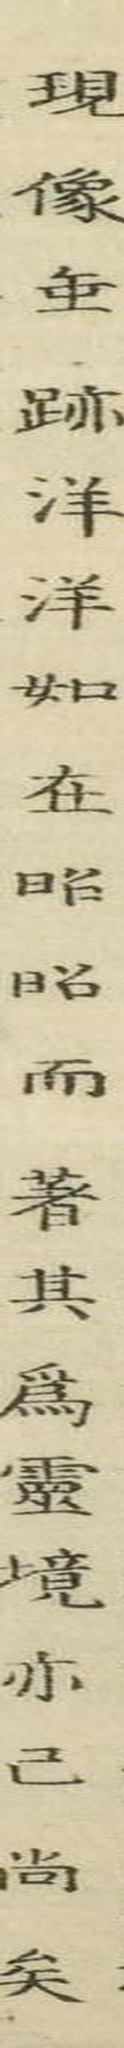現像垂跡洋洋如在昭昭而著其為霊境亦己尚矣
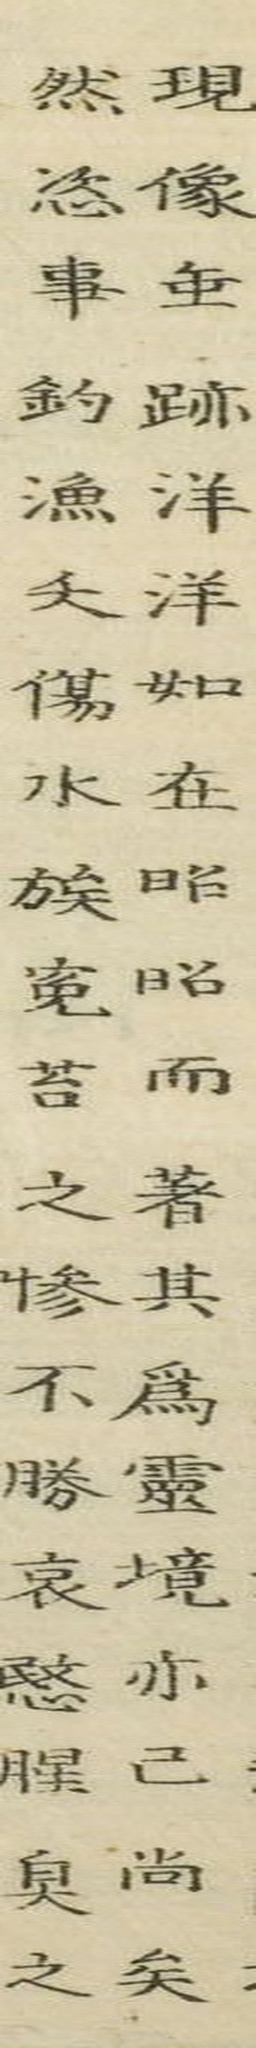然恣事釣漁夭傷水族寃苔之惨不勝哀愍腥臭之
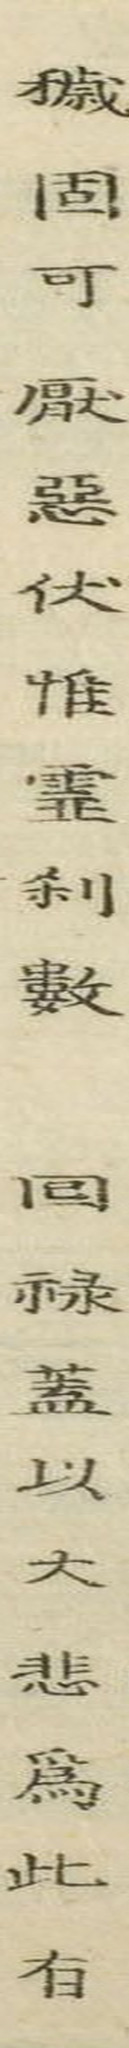穢固可厭悪伏惟霊刹数回禄蓋以大悲為此有
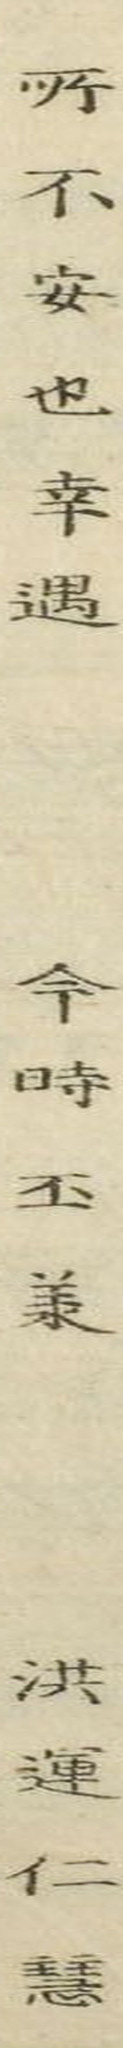所不安也幸遇今時丕承洪運仁慧
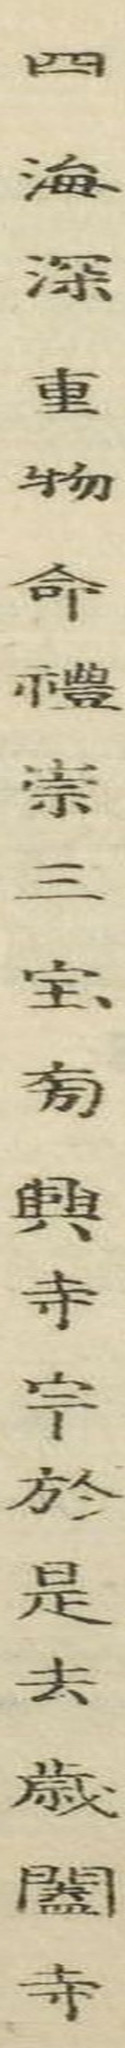四海深重物命礼崇三宝㫄興寺宇於是去歳闔寺
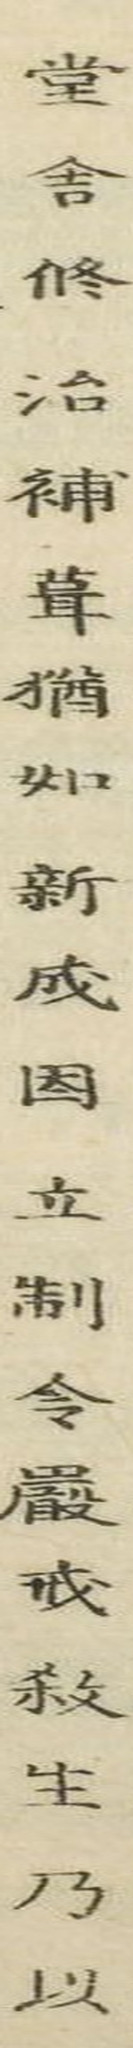堂舎修治補葺猶如新成因立制令厳戒殺生乃以
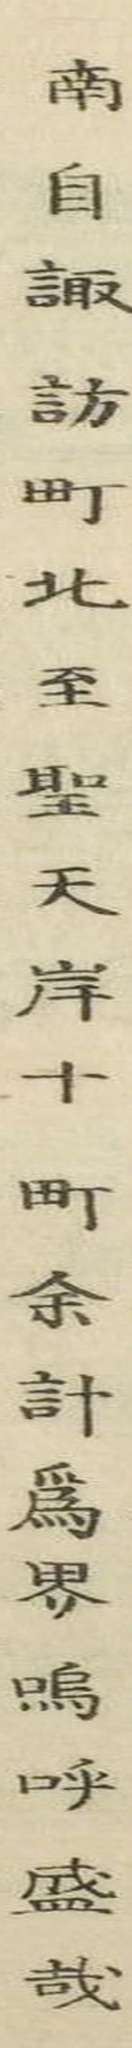南自諏訪町北至聖天岸十町余計為界嗚呼盛哉
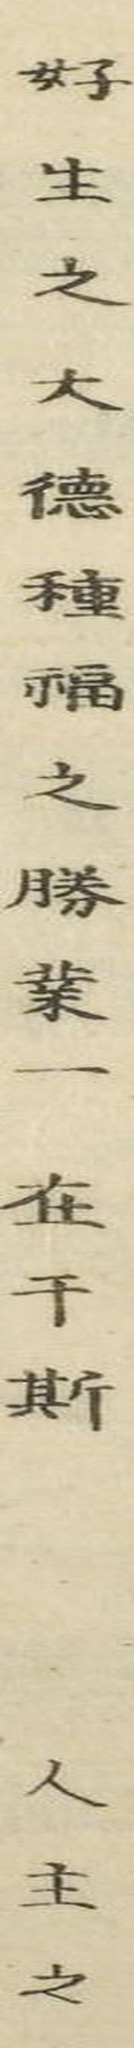好生之大徳種福之勝業一在干斯人主之
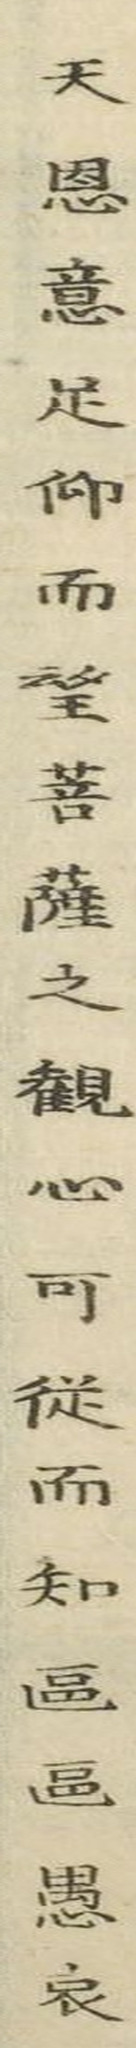天恩意足仰而望菩薩之観心可従而知区区愚哀
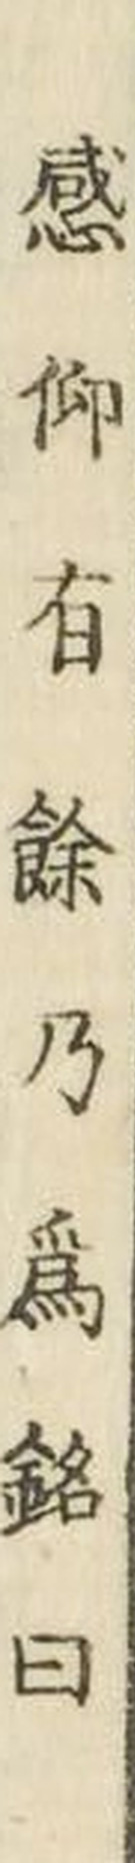感仰有余乃為銘曰
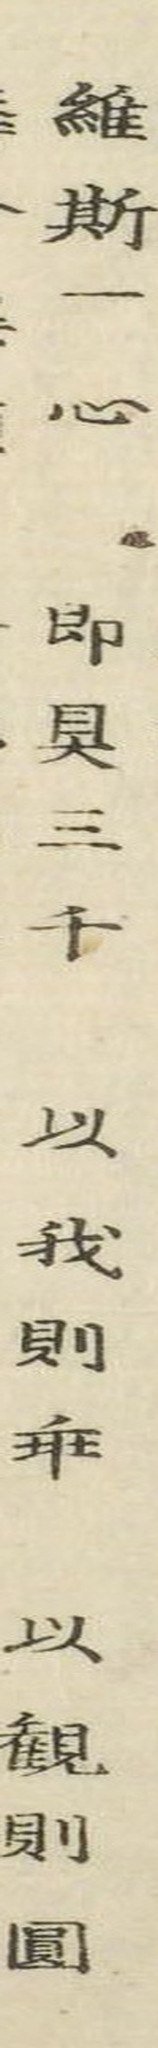維斯一心即具三千以我則乖以観則円
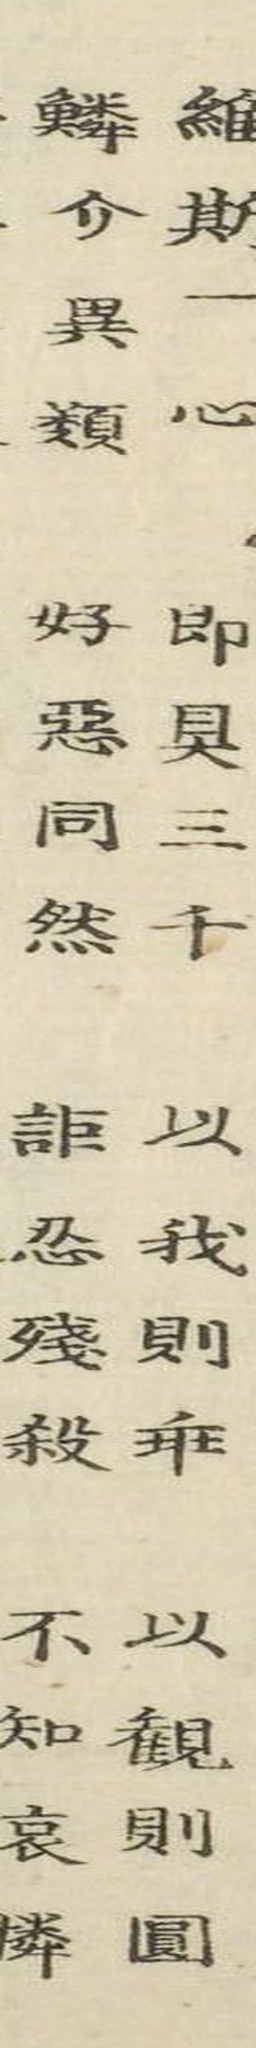鱗介異類好悪同然詎忍残殺不知哀憐
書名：江戸名所図会 20巻 巻之16
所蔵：東京学芸大学教育コンテンツアーカイブ
